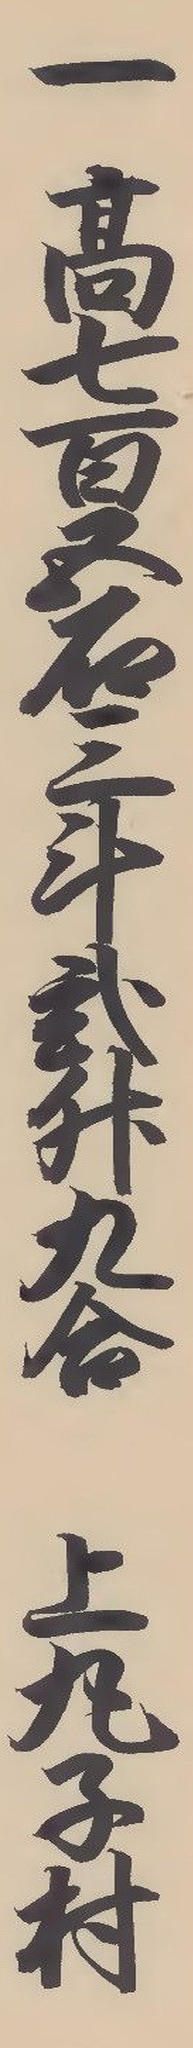一高七百五石三斗弐升九合上丸子村
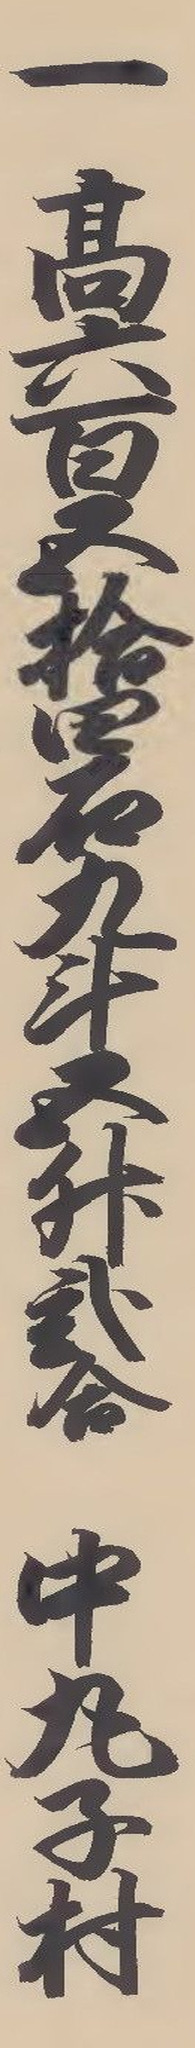一高六百五拾四石九斗五升弐合中丸子村
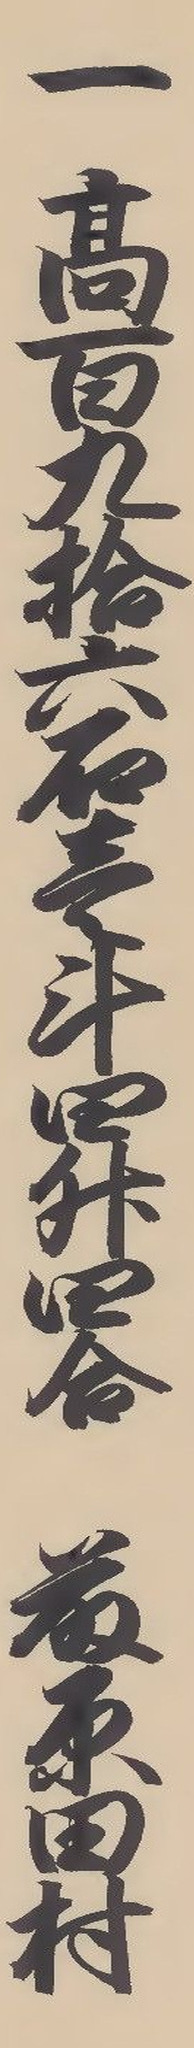一高百九拾六石壱斗四升四合藤原田村
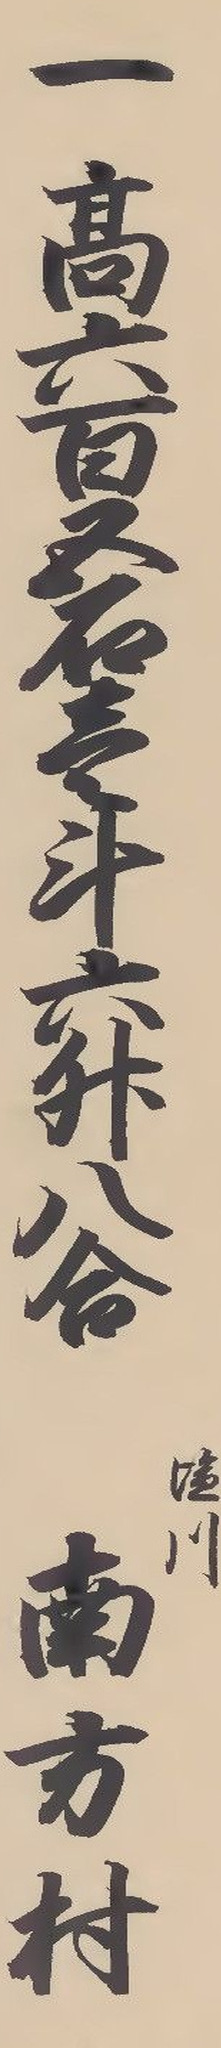一高六百五石壱斗六升八合南方村
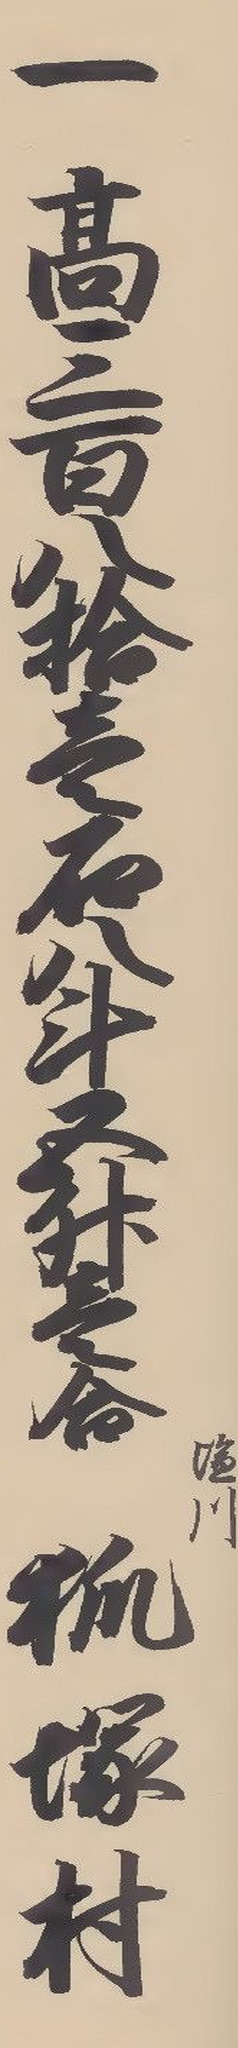一高三百八拾壱石八斗五升壱合狐塚村
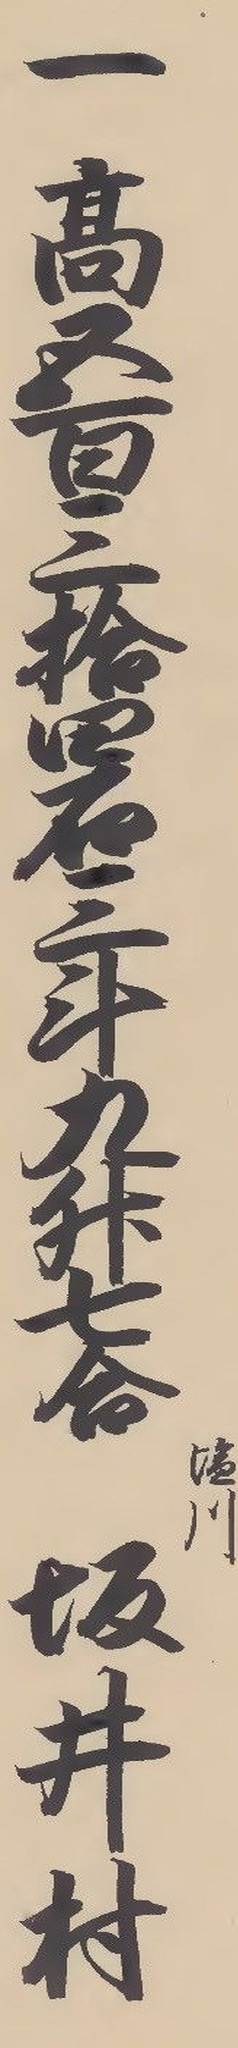一高五百三拾四石三斗九升七合坂井村
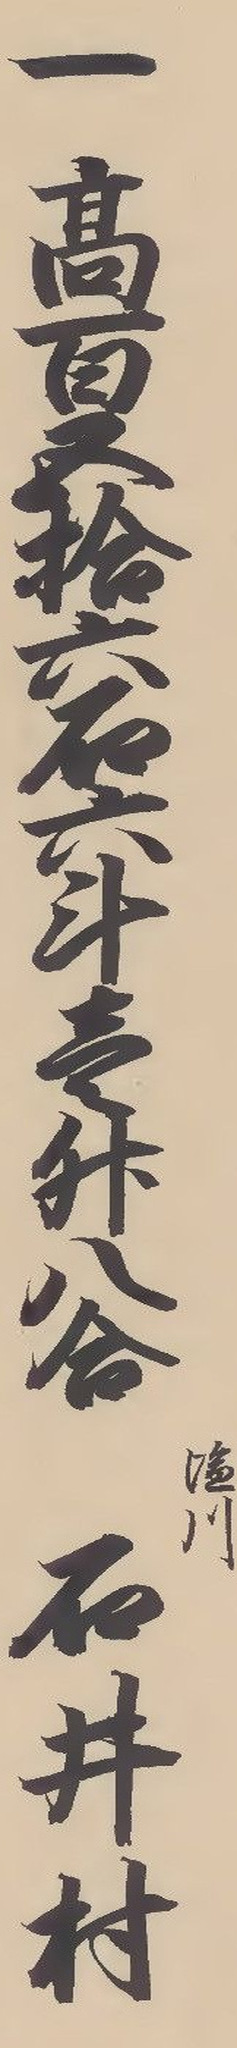一高百五拾六石六斗壱升八合石井村
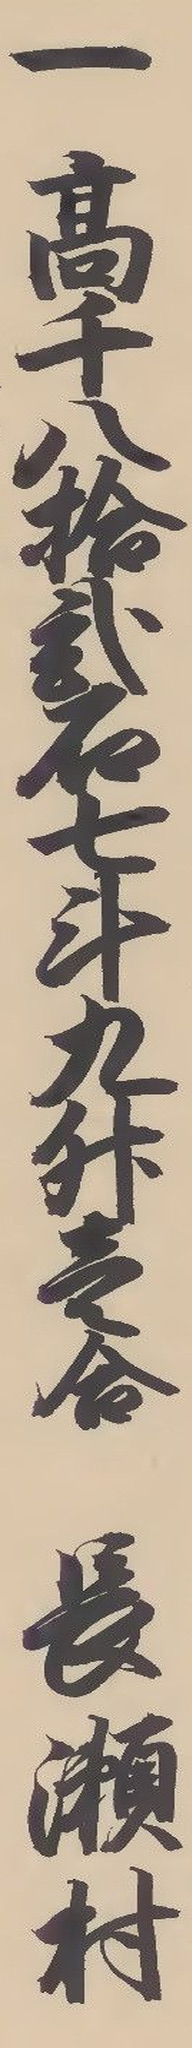一高千八拾弐石七斗九升壱合長瀬村

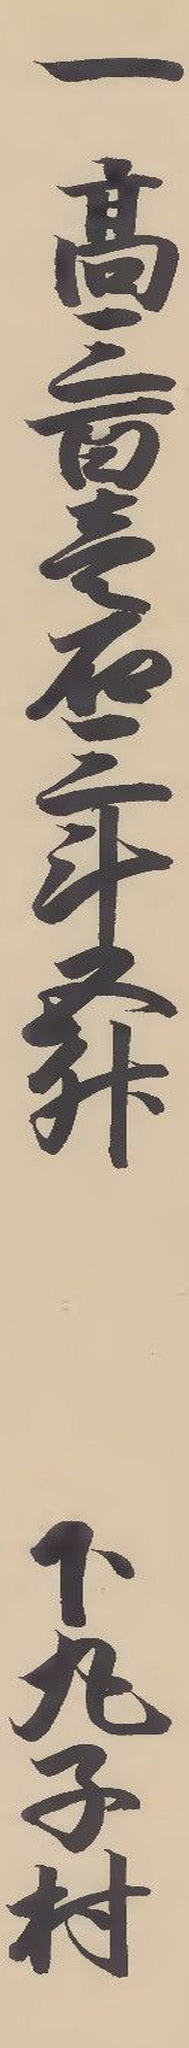一高三百壱石三斗五升下丸子村
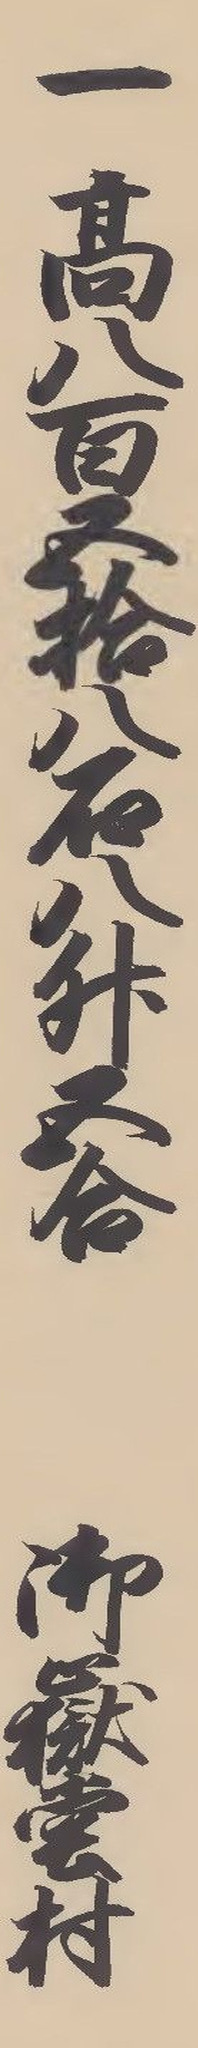一高八百五拾八石八升五合御嶽堂村
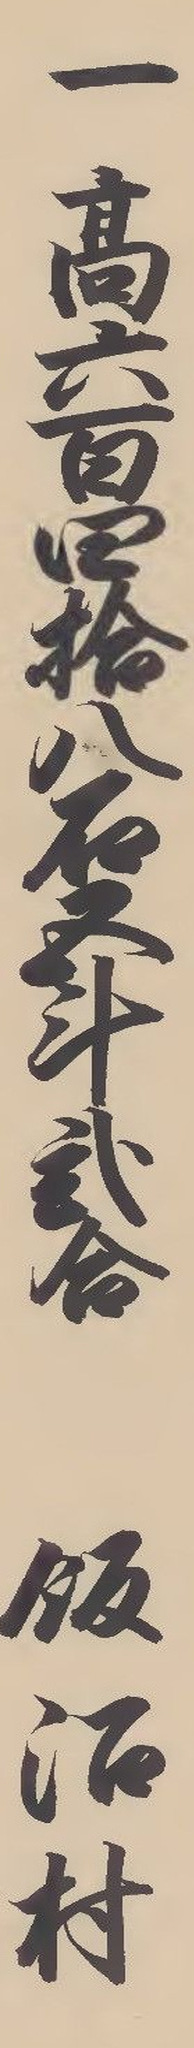一高六百四拾八石五斗弐合飯沼村
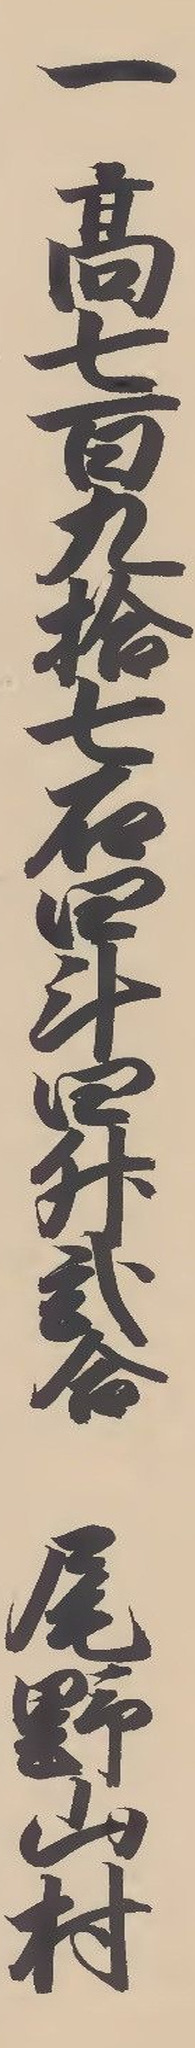一高七百九拾七石四斗四升弐合尾野山村
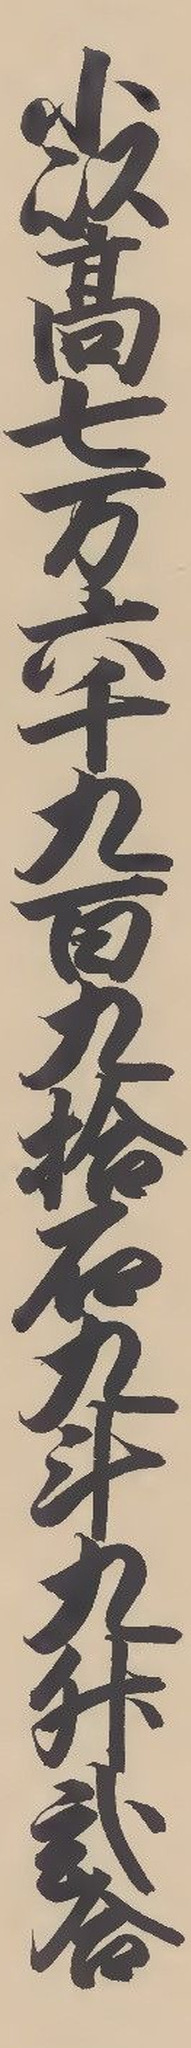小以高七万六千九百九拾石九斗九升弐合

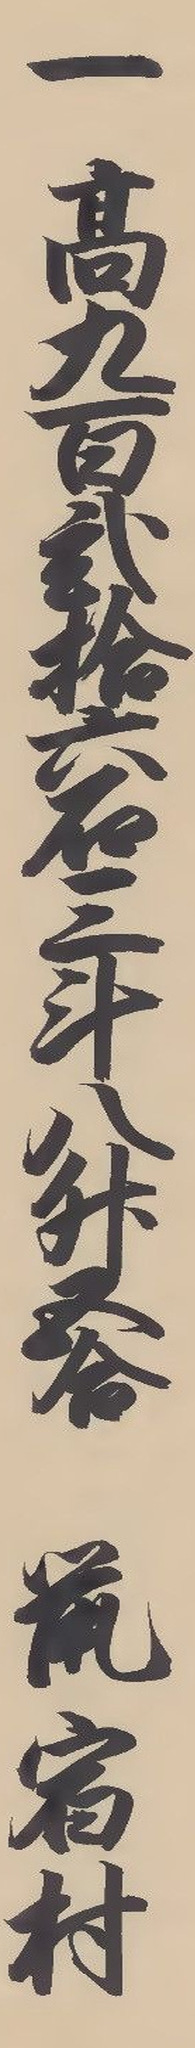一高九百弐拾六石三斗八升五合鼠宿村
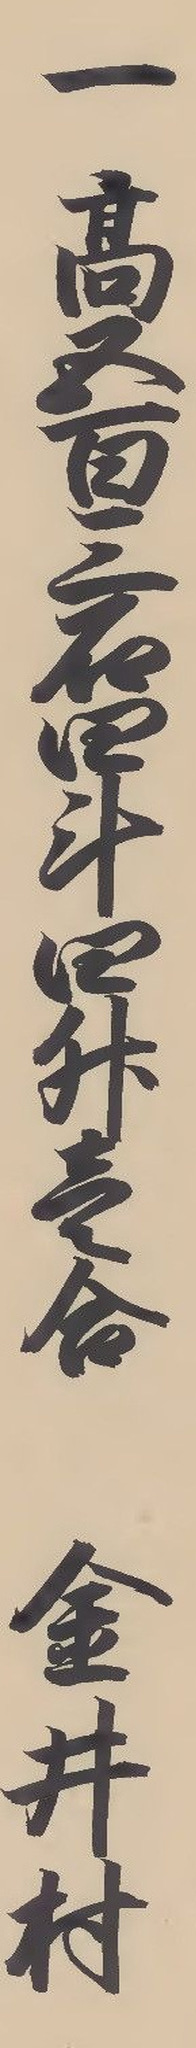一高五百三石四斗四升壱合金井村
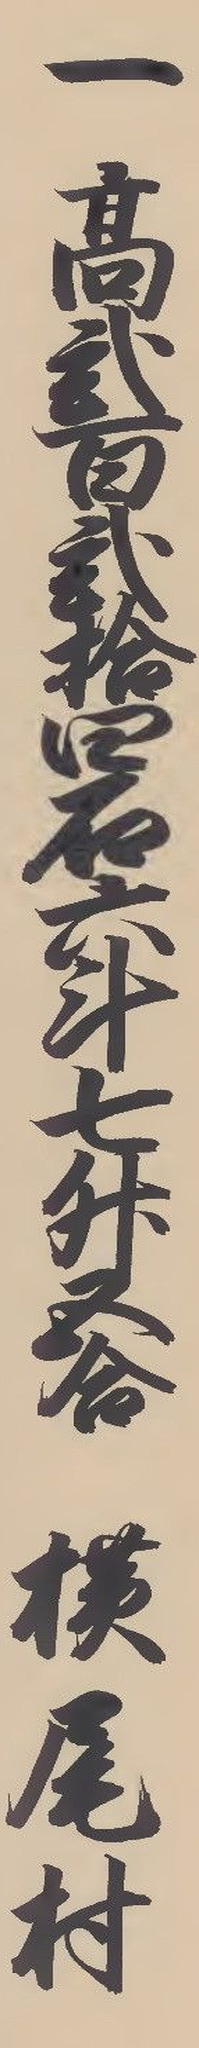一高弐百弐拾四石六斗七升五合横尾村
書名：信濃国郷帳
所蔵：国立公文書館 National Archives of Japan
